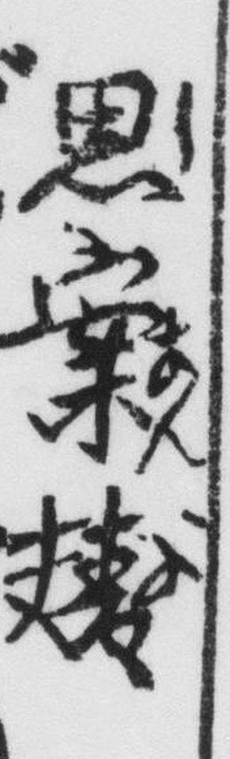思案麩
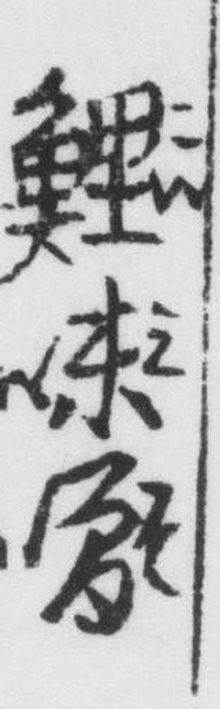鯉味噌
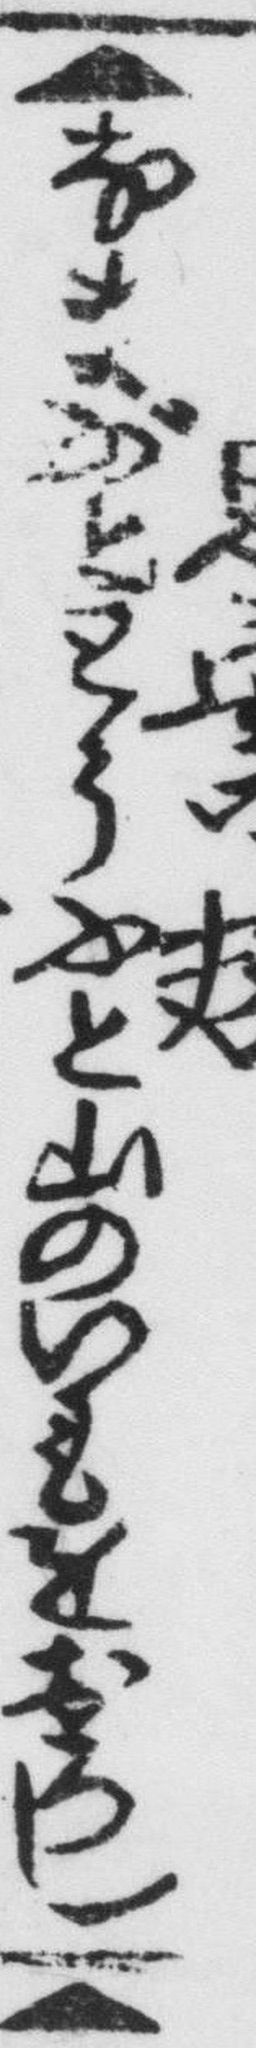▲なまぶととうふと山のいもをおろし
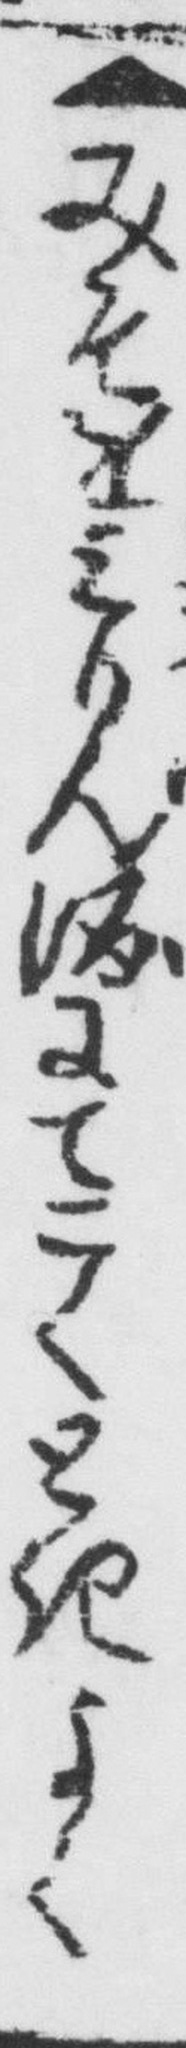▲みそをミりん酒にてときよく
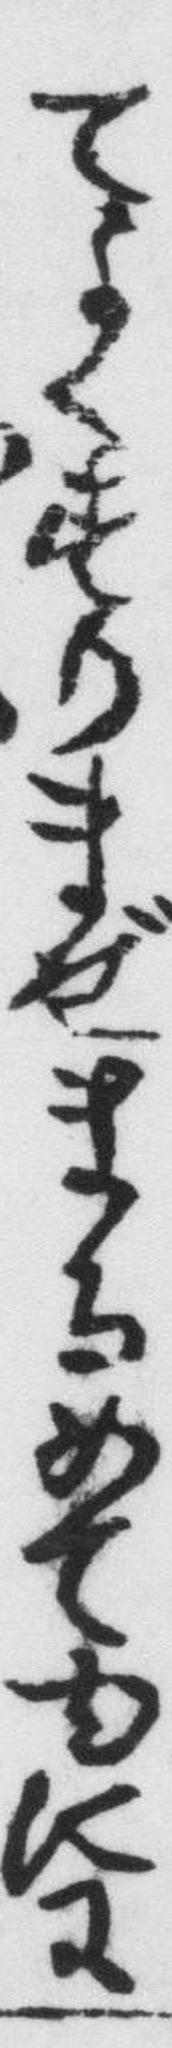てよくすりまぜまるめてすに
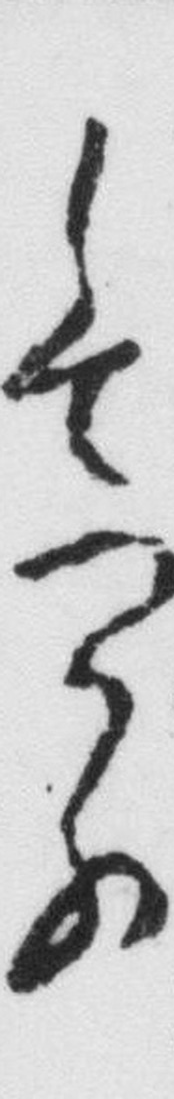してつかふ
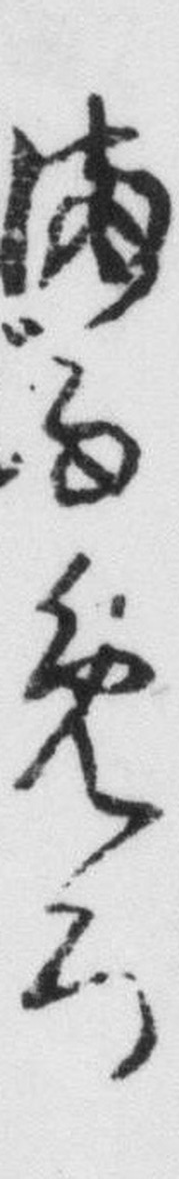まるめろ
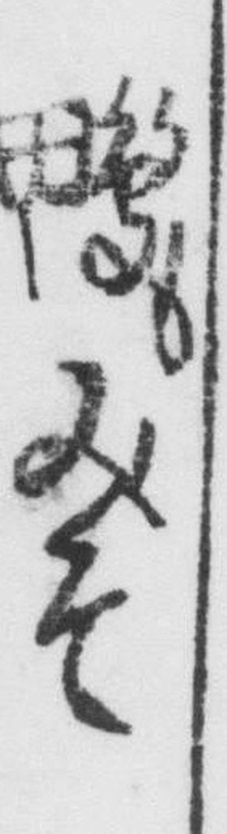鴨みそ
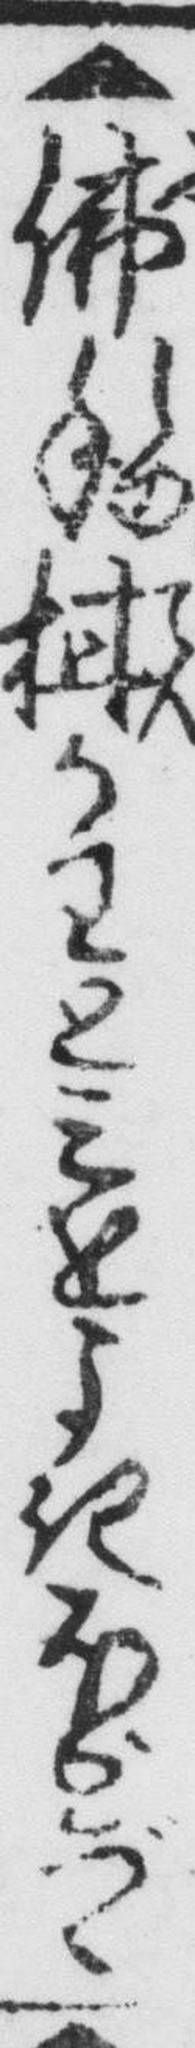▲佛手柑うすくミをよきほどづゝ
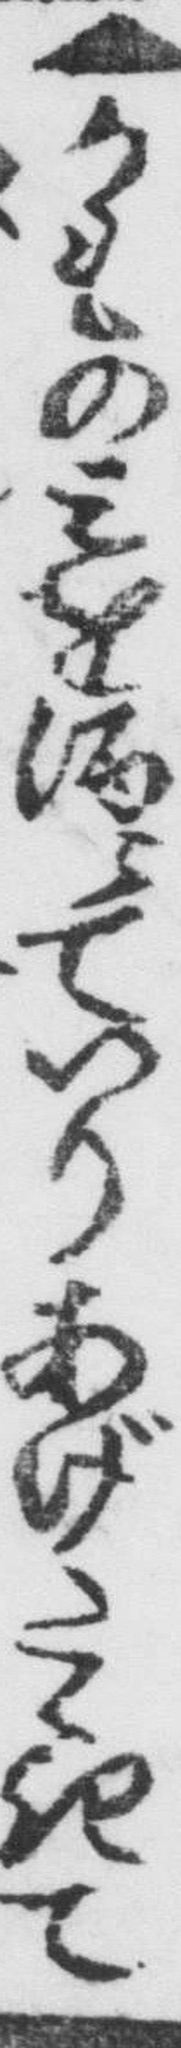▲かものミを酒ニていりあげたてきて
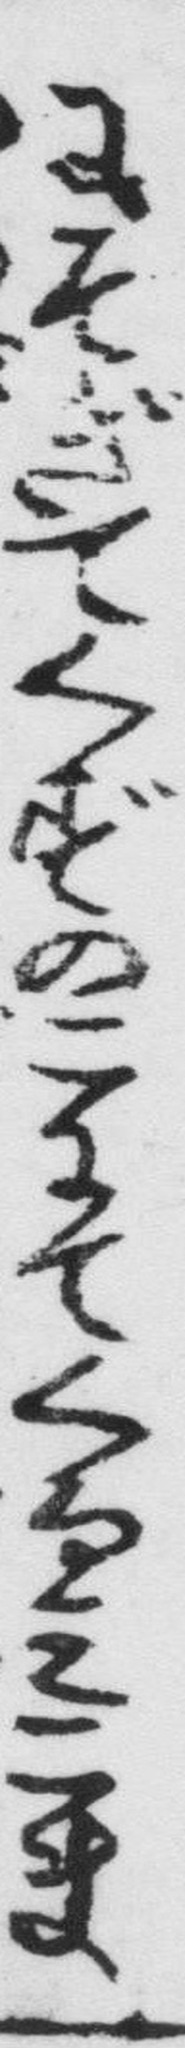にそぎてくずのこにてくるミこま
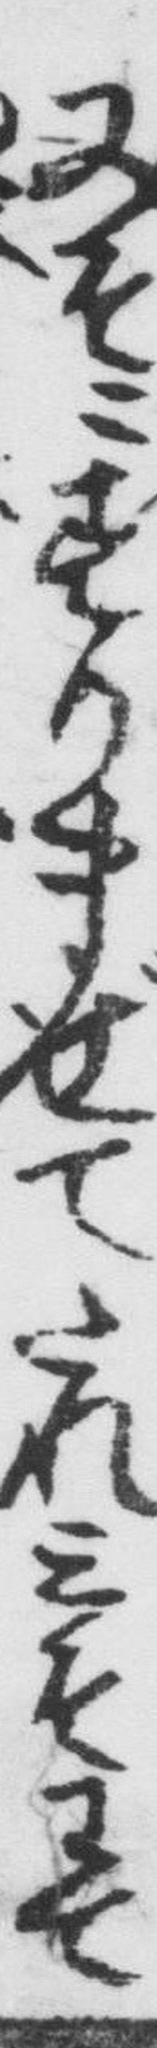みそニすりまぜてたれミそにて
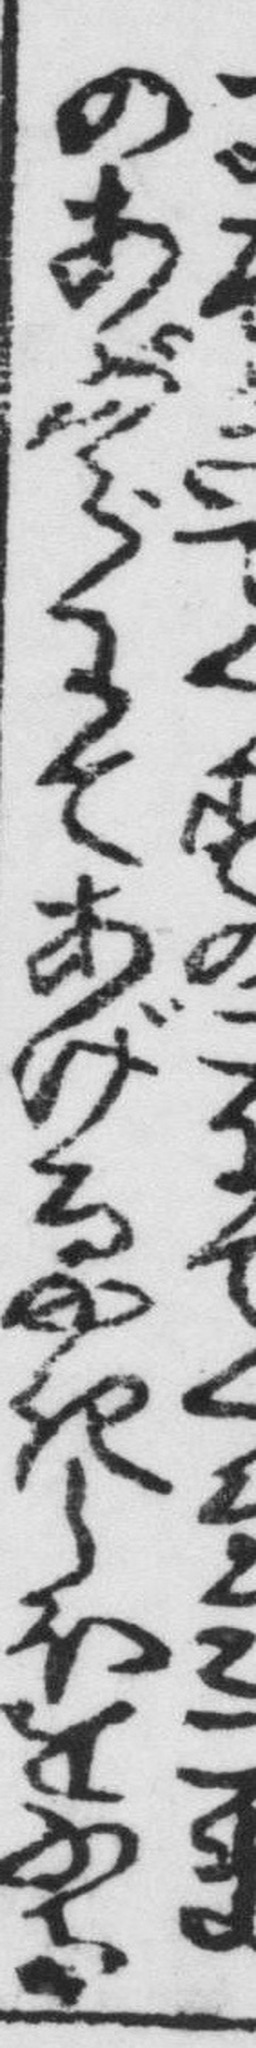のあぶらにてあげるやきしほをふる
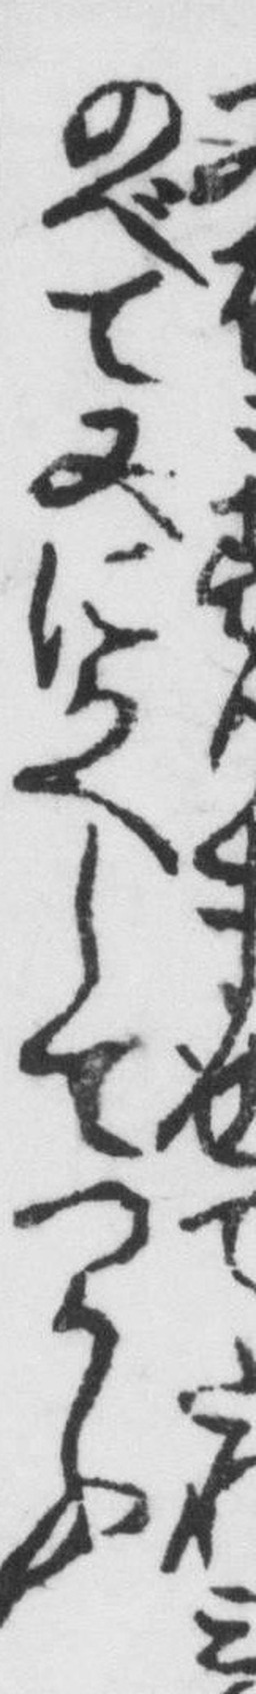のべて又にかへしてつかふ
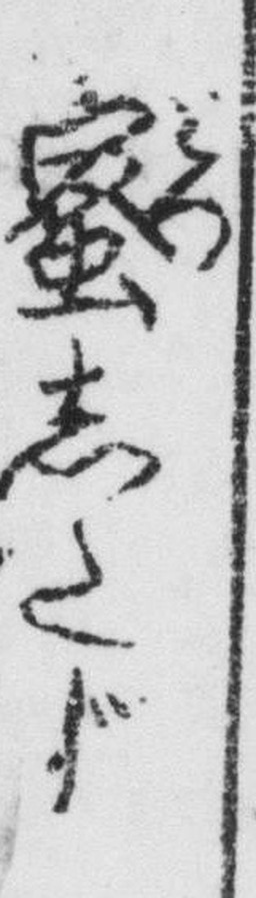蜜したじ
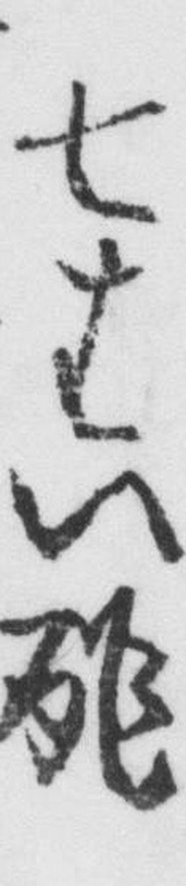七はい酢
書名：即席料理/早指南
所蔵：大阪府立大学学術情報センター 国文学研究資料館
